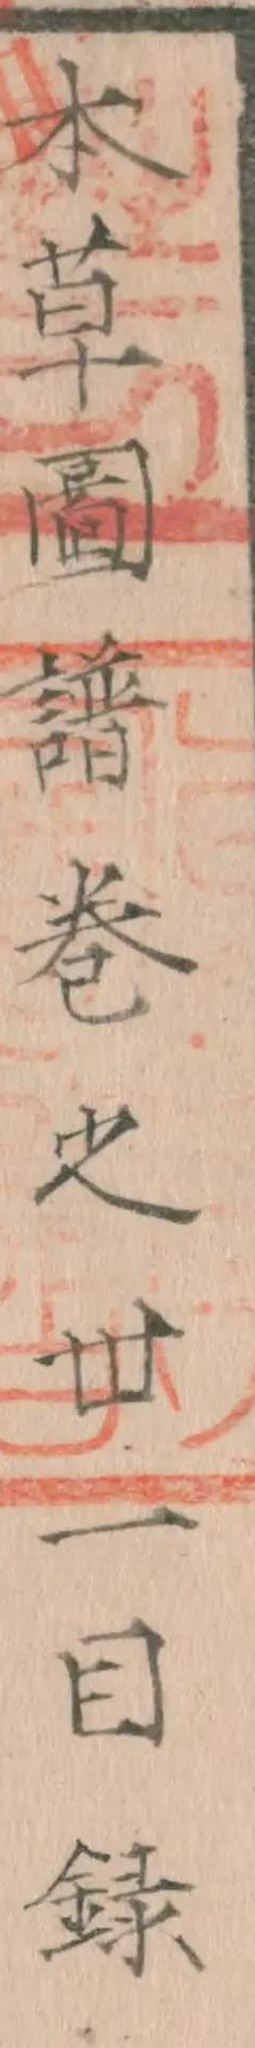本草図譜巻之丗一目録
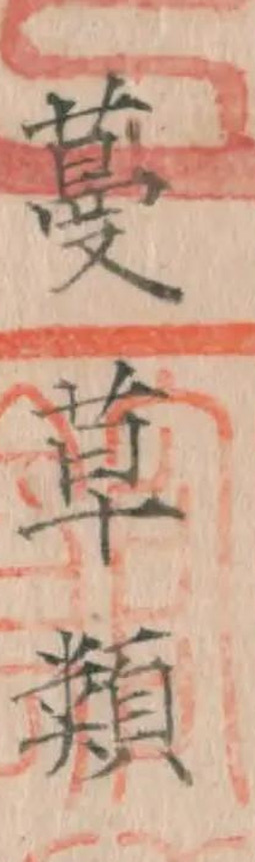蔓草類
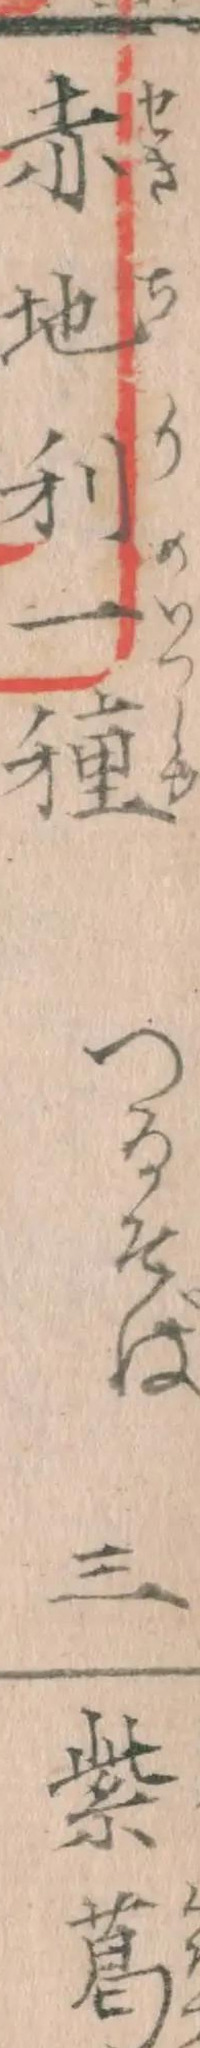赤地利一種つるそば三紫葛

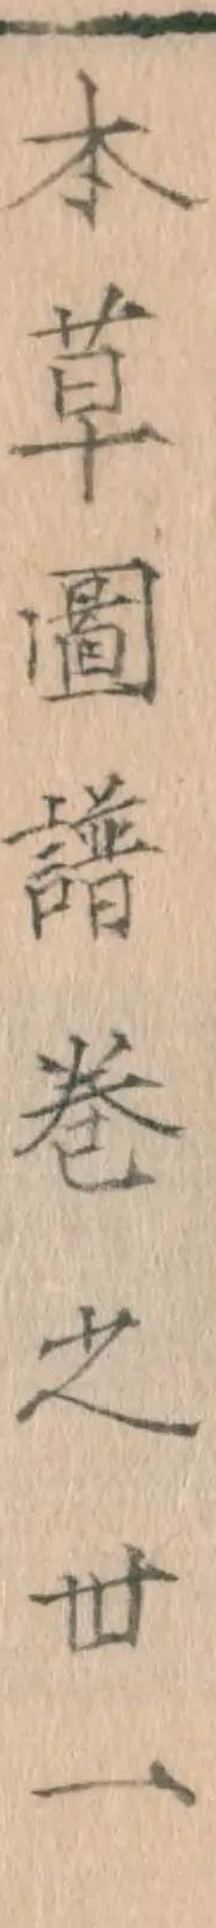本草図譜巻之丗一
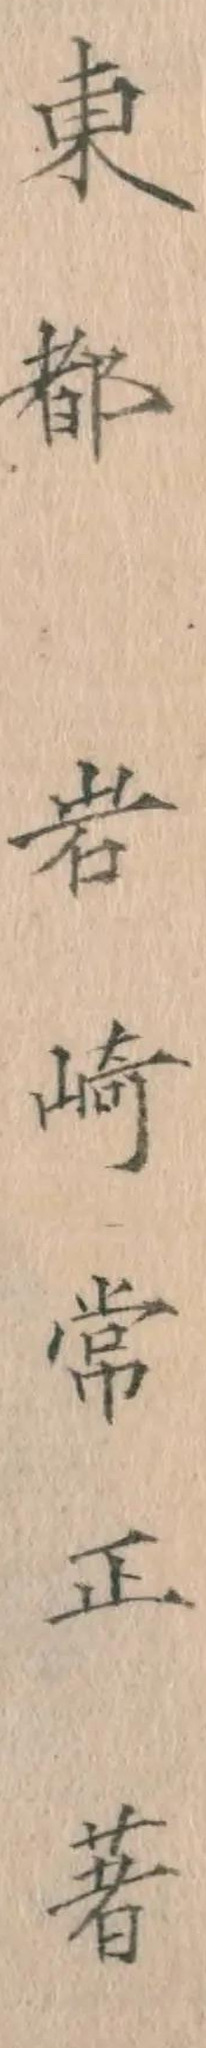東都岩崎常正著
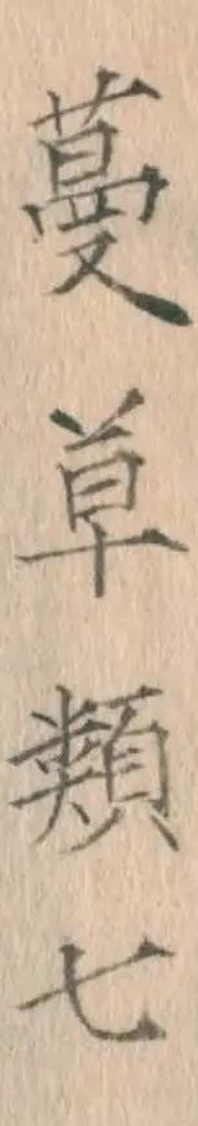蔓草類七
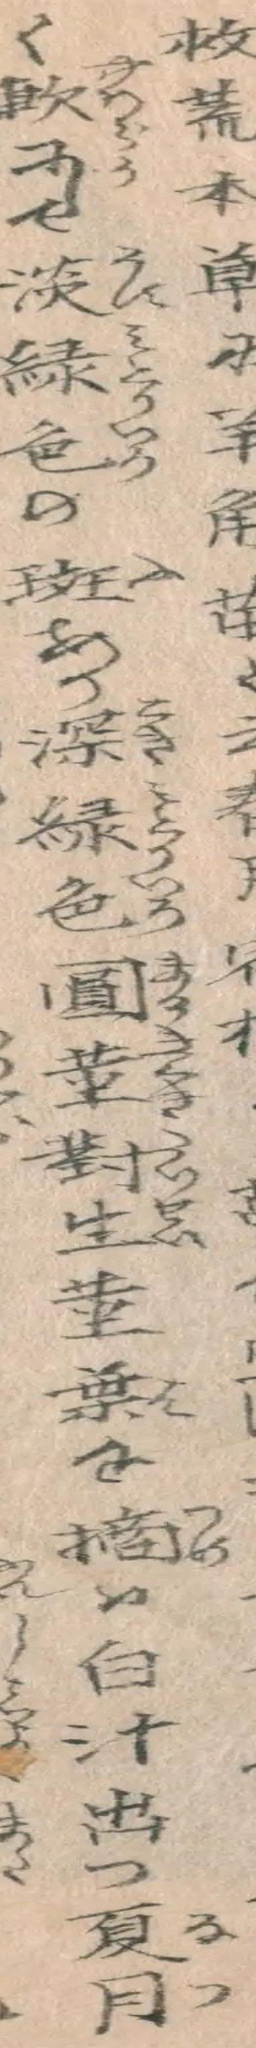く軟にして淡緑色の斑あり深緑色円茎対生茎葉を摘は白汁出つ夏月
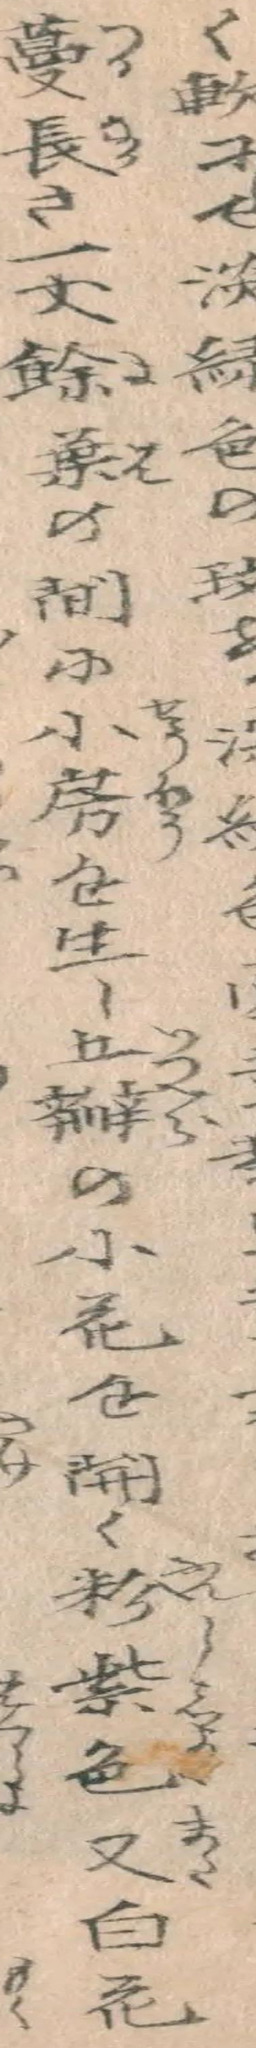蔓長さ一丈余葉の間に小房を生し五弁の小花を開く粉紫色又白花
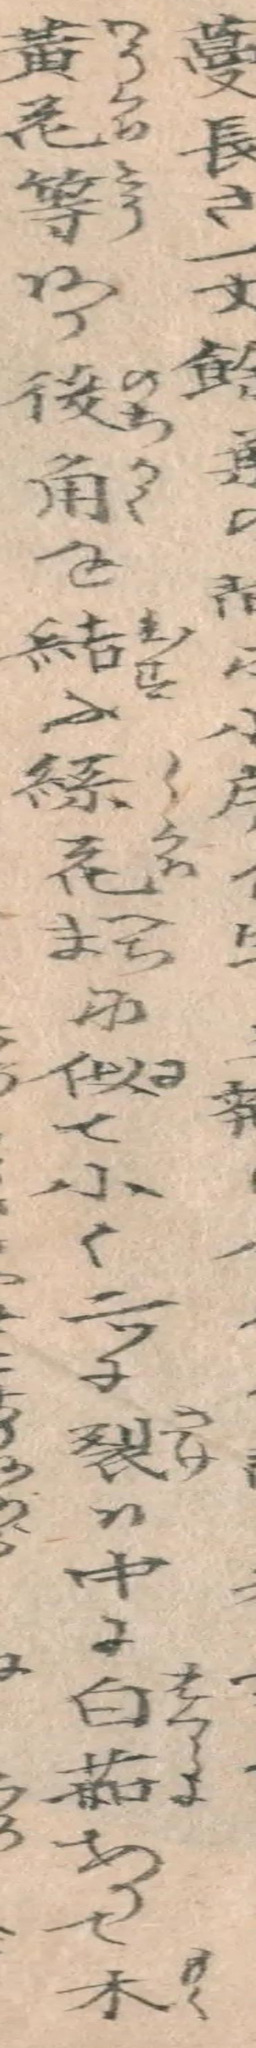黄花等あり後角を結ふ糸花へちまに似て小く二ッに裂は中に白茹ありて木
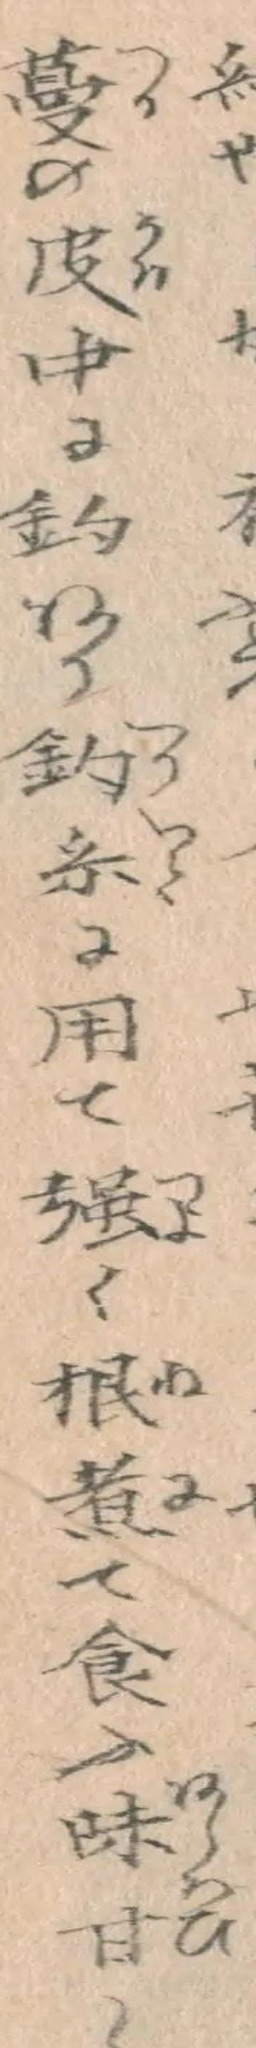蔓の皮中に釣あり釣糸に用て強く根煮て食ふ味甘し

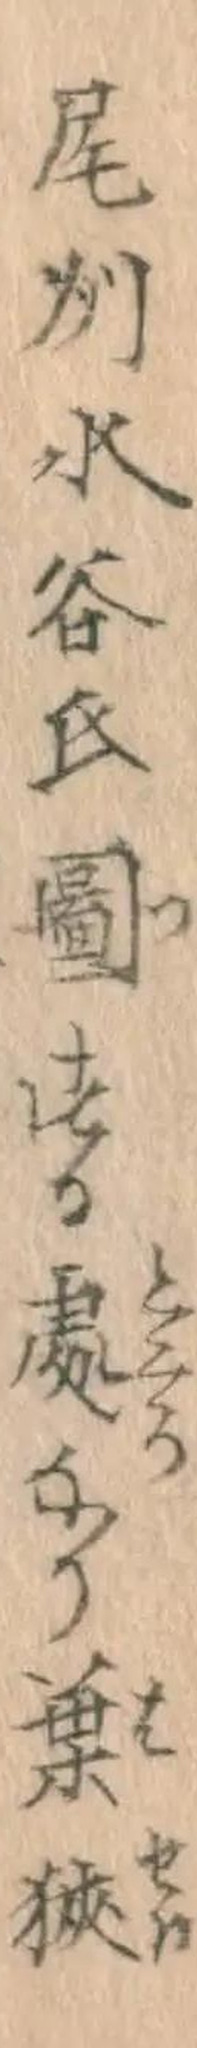尾州水谷氏図する処なり葉狭
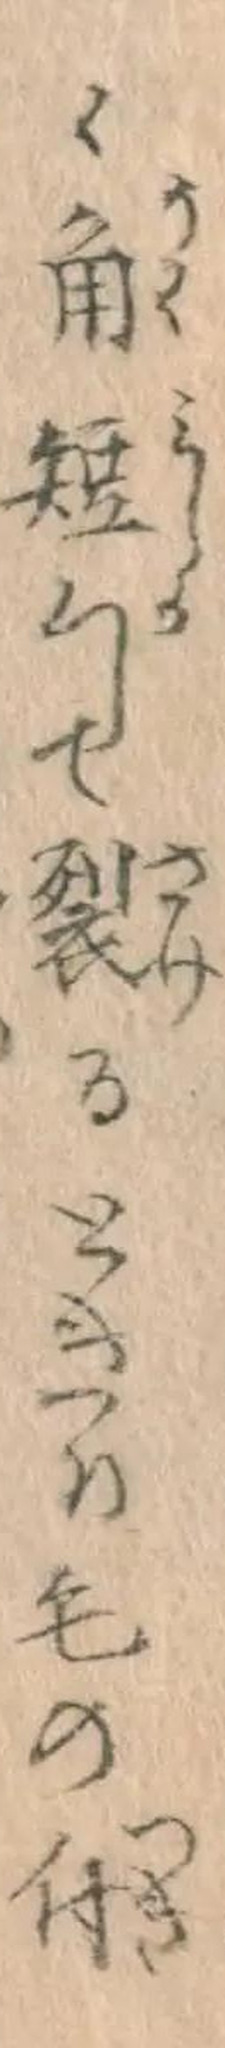く角短くして裂るときは毛の付
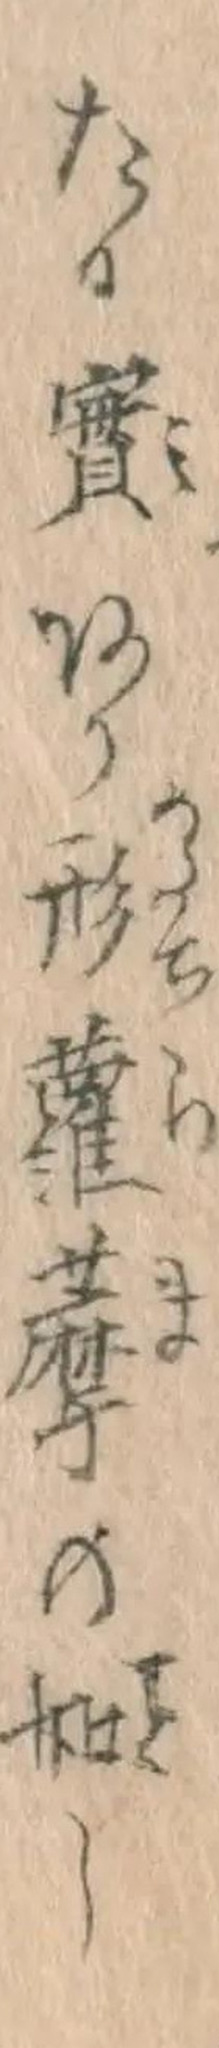たる実あり形蘿藦の如し
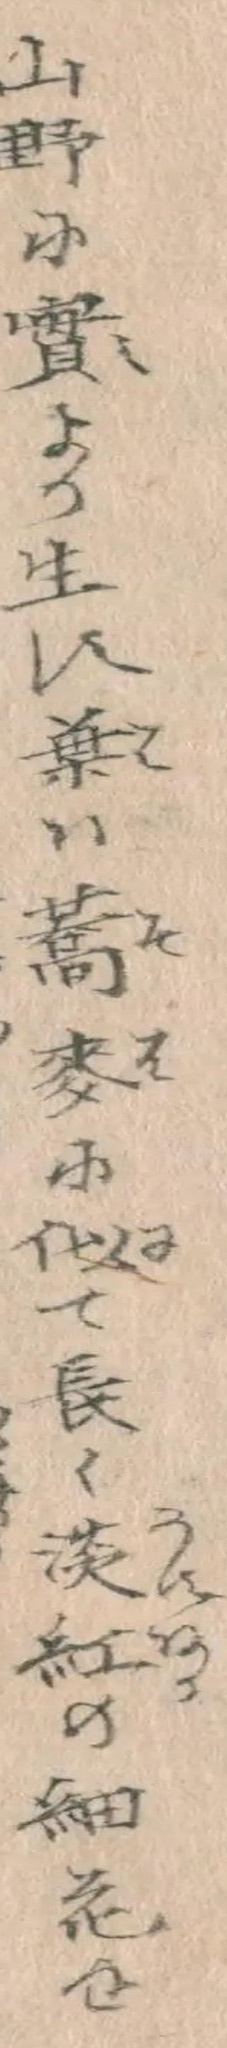山野に実より生す葉は蕎麦に似て長く淡紅の細花を
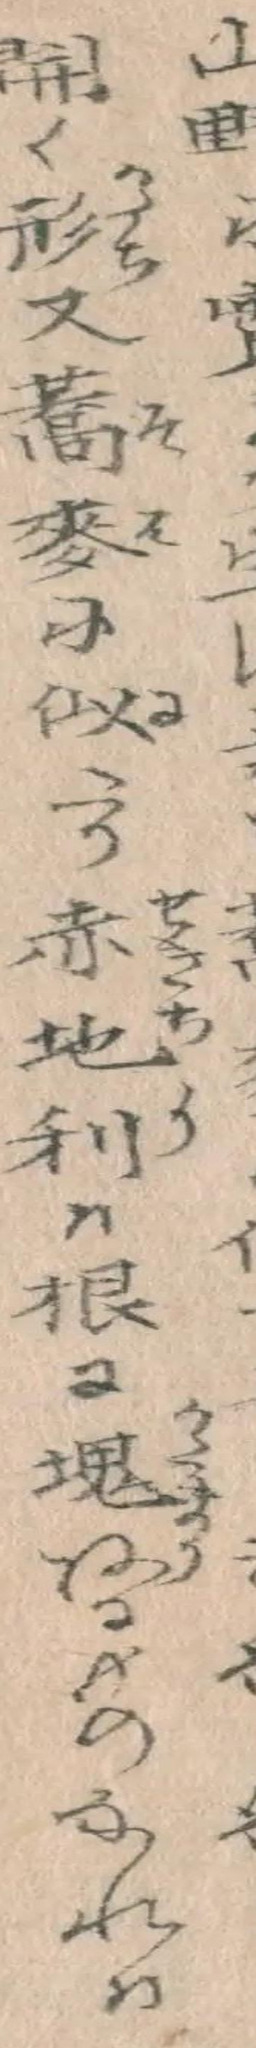開く形又蕎麦に似たり赤地利は根に塊あるものなれは
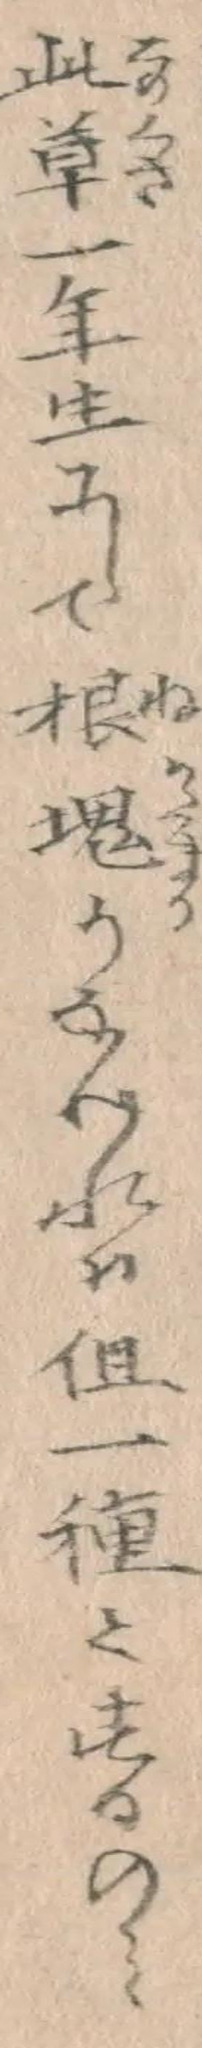此草一年生にして根塊なけれは但一種とするのみ
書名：本草図譜. 巻31-33
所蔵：国立国会図書館 National Diet Library, JAPAN
